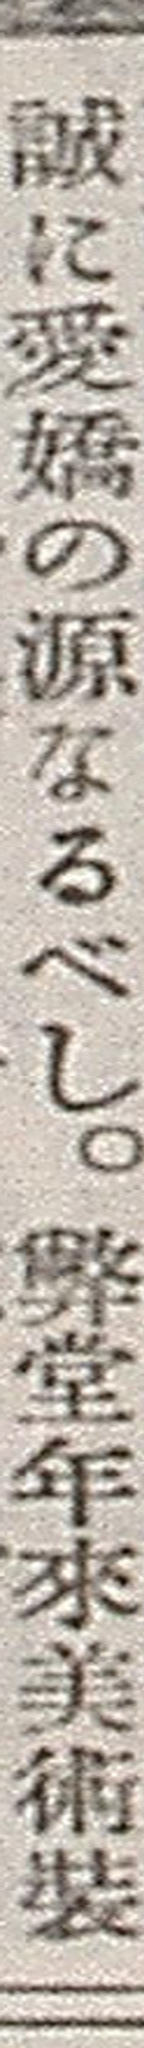誠に愛嬌の源なるべし。弊堂年来美術装
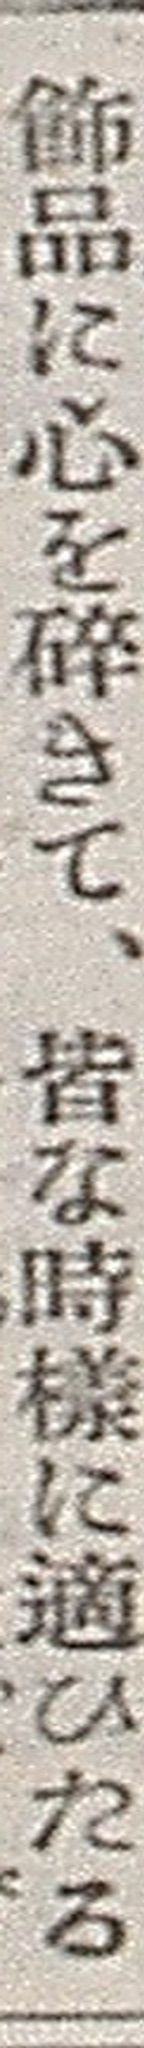飾品に心を砕きて、皆な時機に適ひたる
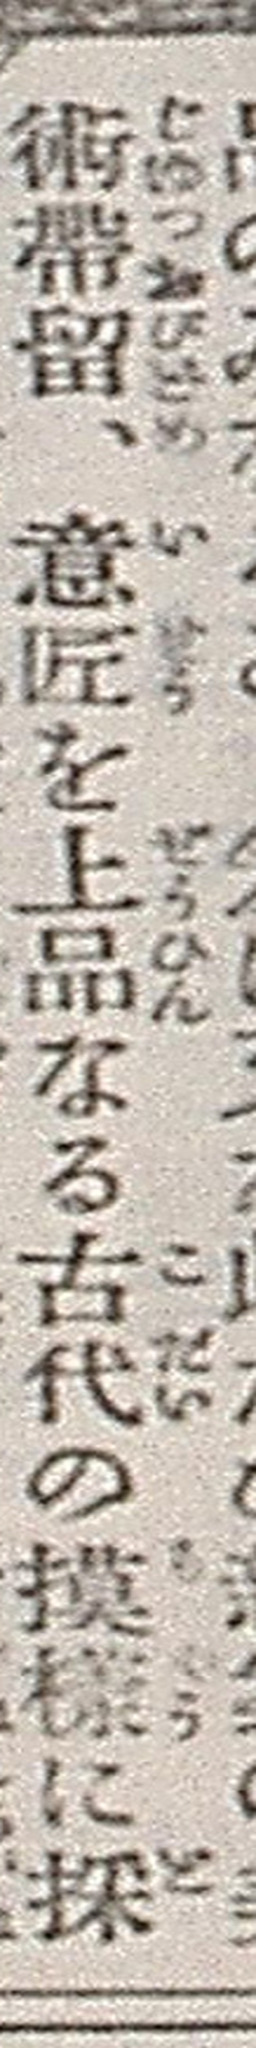術帯留、意匠なる古代の模様に採
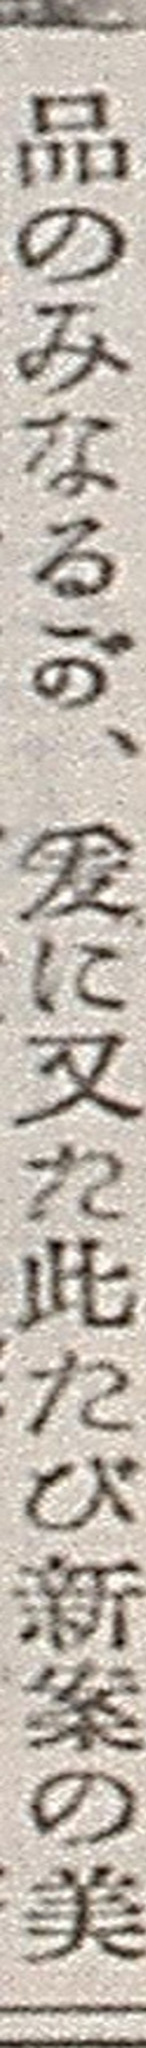品のみなるが、爰に又た此たび新案の美
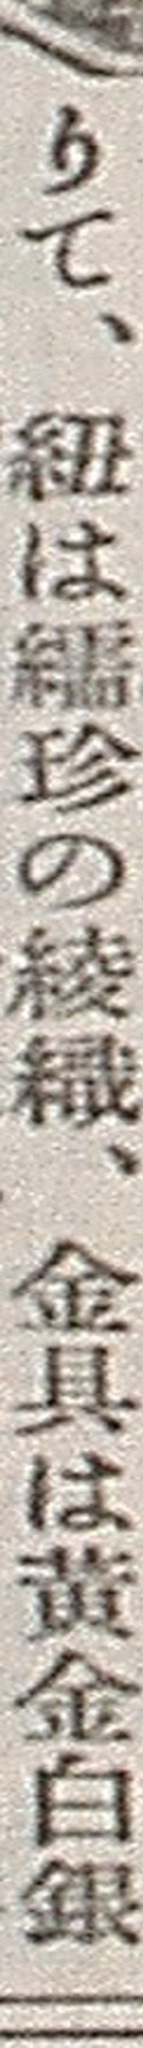りて、紐は縹珍の綾織、金具は黄金白銀
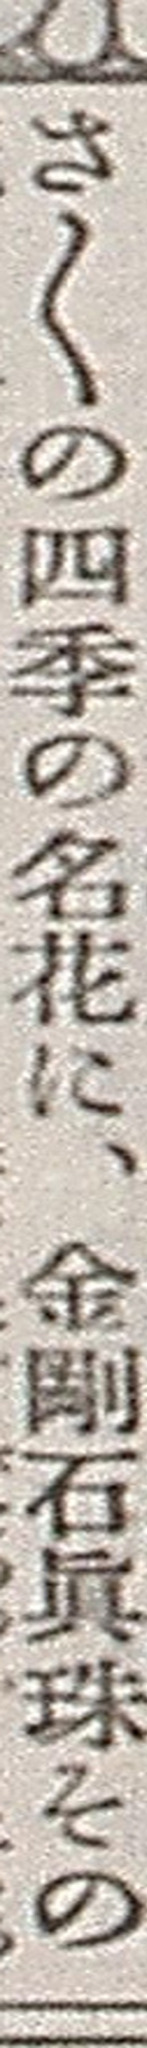さ〳〵の四季の名花に、金剛石真珠その
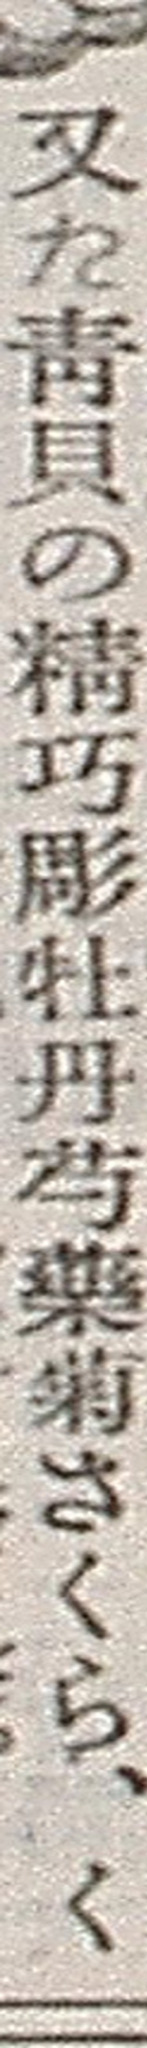又た青貝の精巧彫牡丹芍薬菊さくら、く
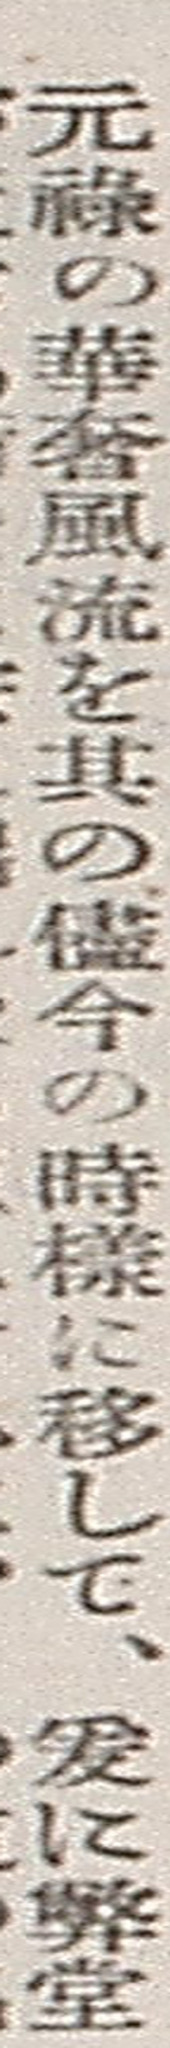元禄の華舎奢風流を其の儘今の時様に移して、爰に弊堂
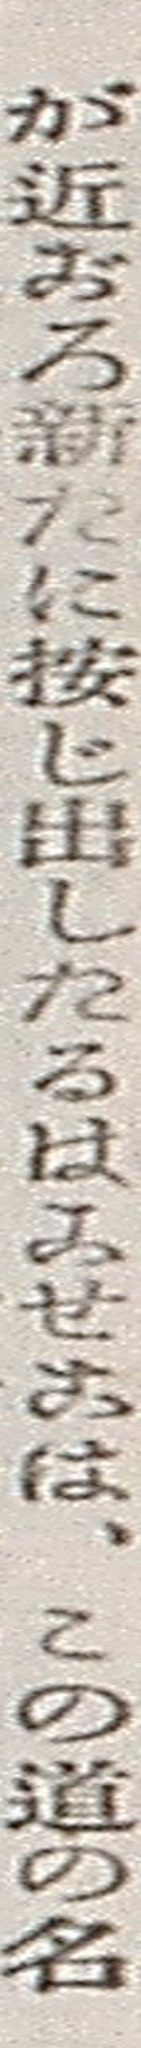が近ごろ新たに按じ出したるはこせこは、この道の名
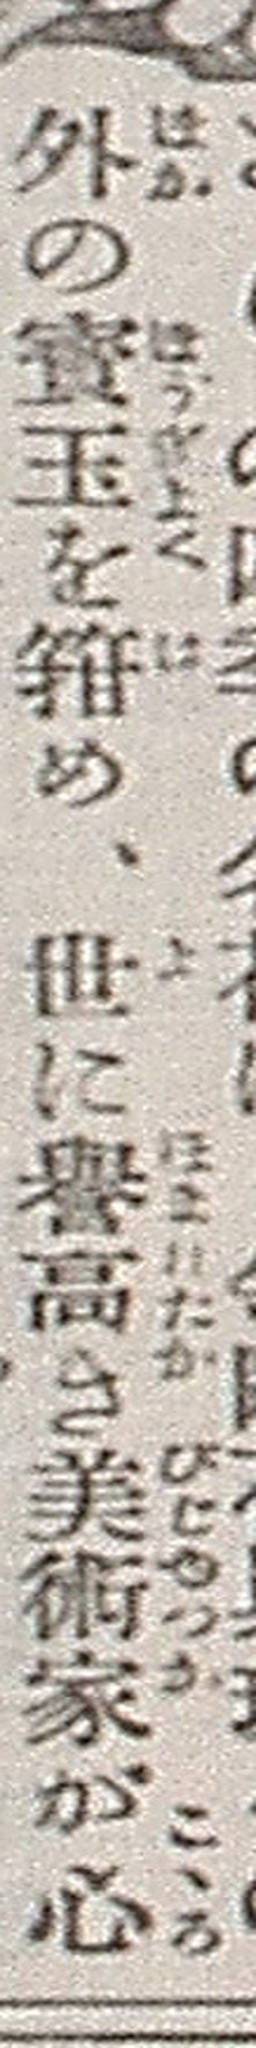外の宝玉を箝め、世に誉高き美術家が心
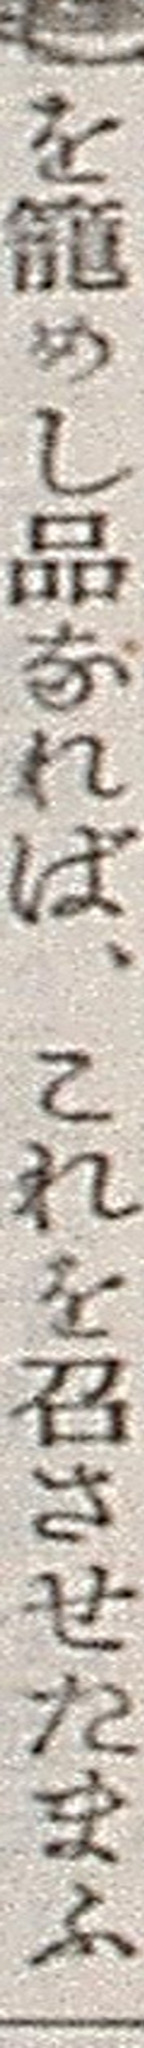を籠めし品なれば、これを召させたまふ
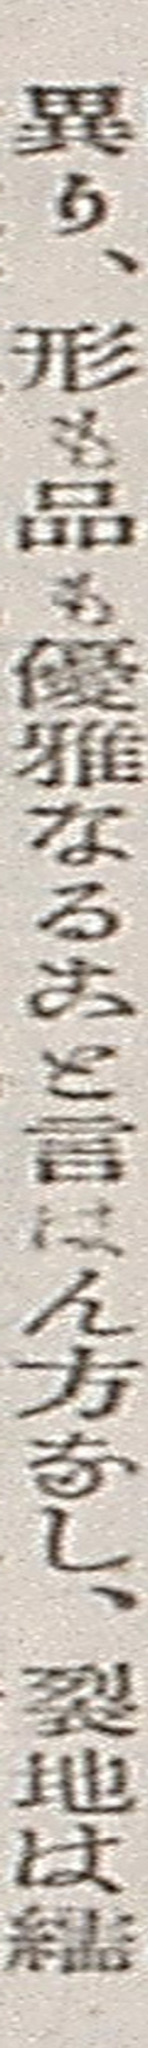異り、形も品も優雅なること言はん方なし、裂地は縮
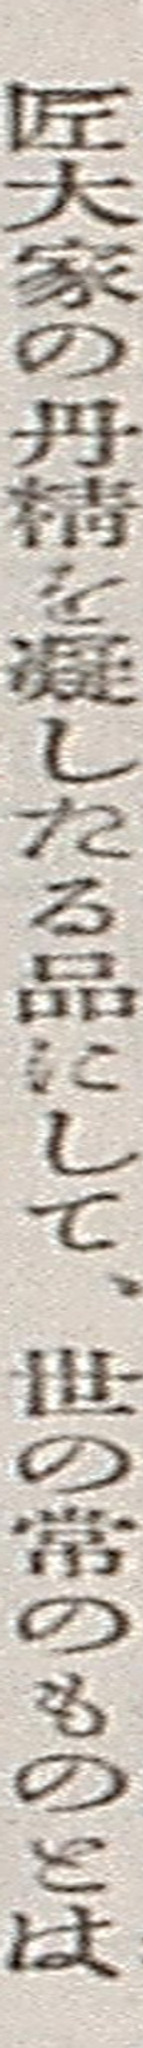匠大家の丹精を凝したる品にして、世の常のものとは
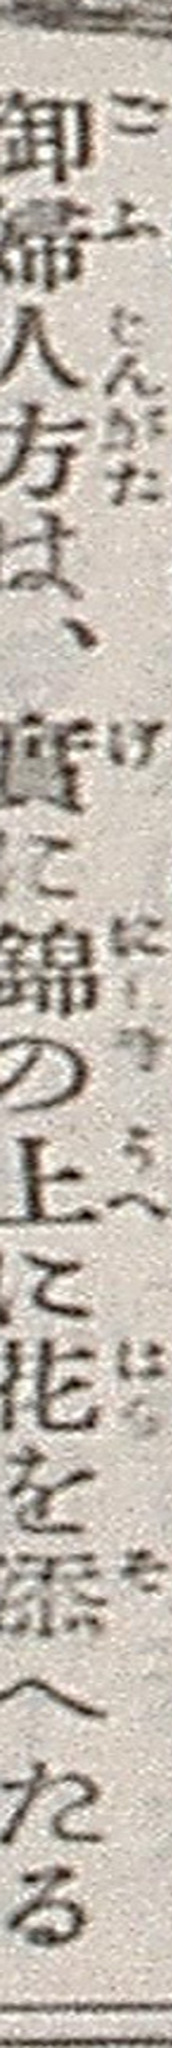御婦人方は、実に錦の上に花を添へたる
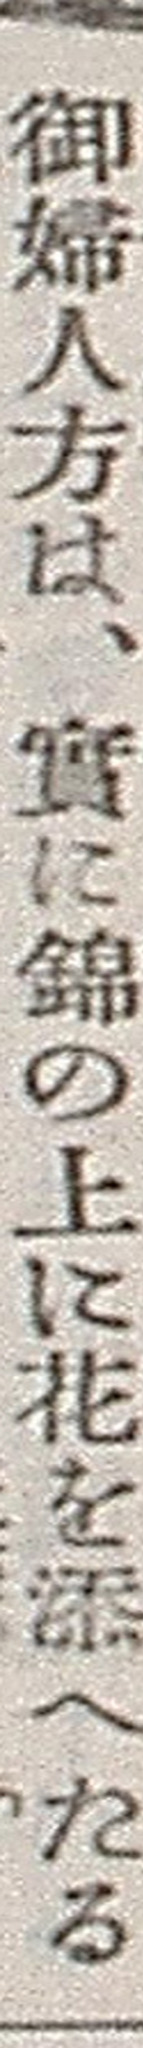御婦人方は、実に錦の上に花を添へたる
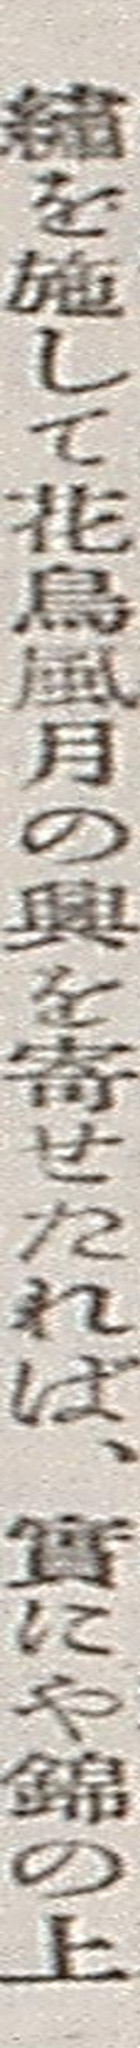繍を施して花鳥風月の興を寄せたれば、実にや錦の上
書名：風俗畫報臨時増刊第百二十六號　洪水被害録（中）
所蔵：東京大学地震研究所図書室 Earthquake Research Institute Library, The University of Tokyo, JAPAN
